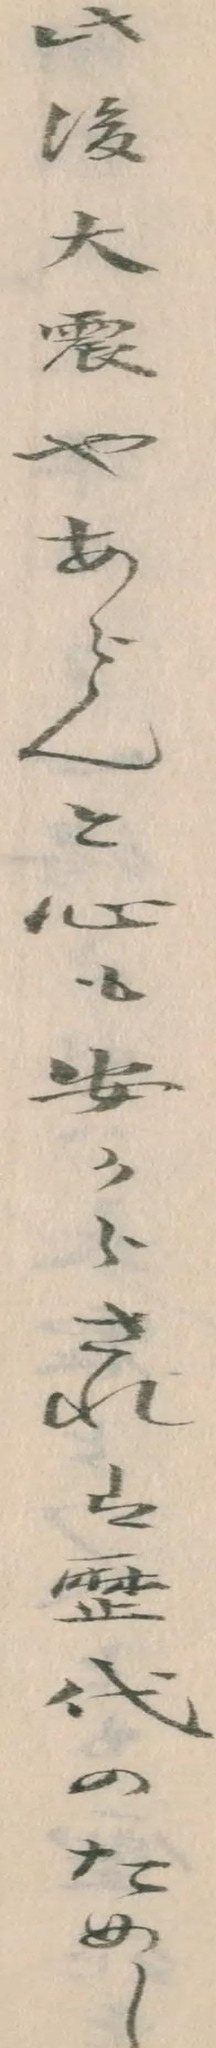此後大震やあらんと心も安からされは歴代のためし
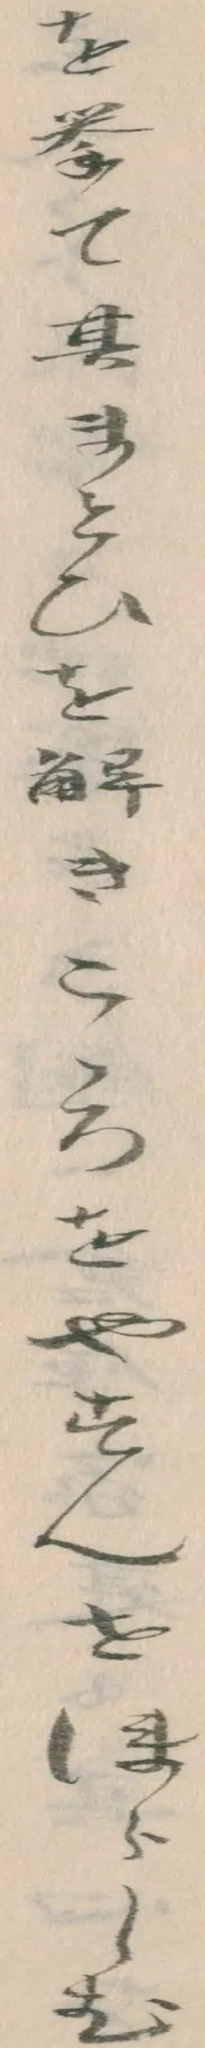を挙て其まとひを解きこゝろをやすんせらしむ
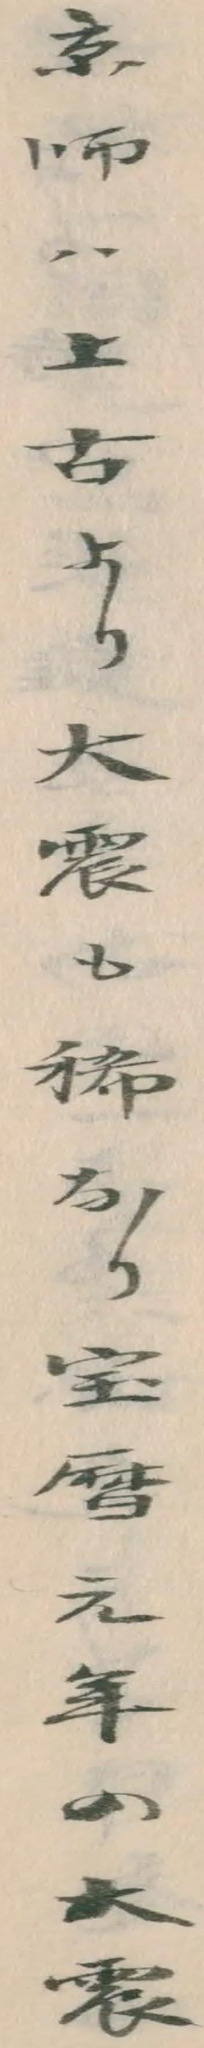京師は上古より大震も稀なり宝暦元年の大震
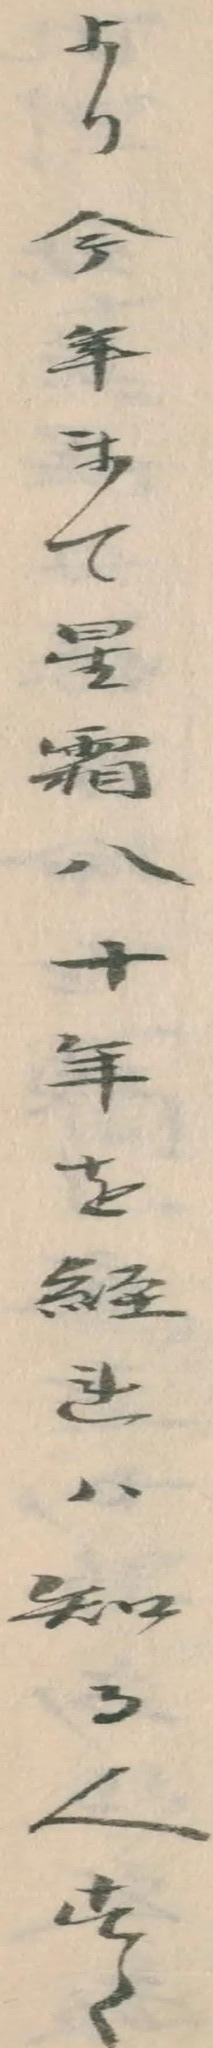より今年まて星霜八十年を経れは知る人すく

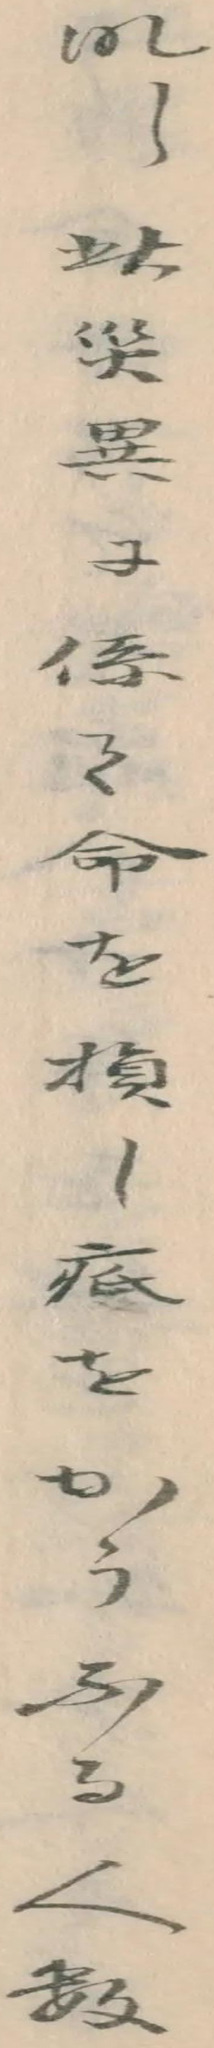なし此災異に係て命を損し疵をかうふる人数
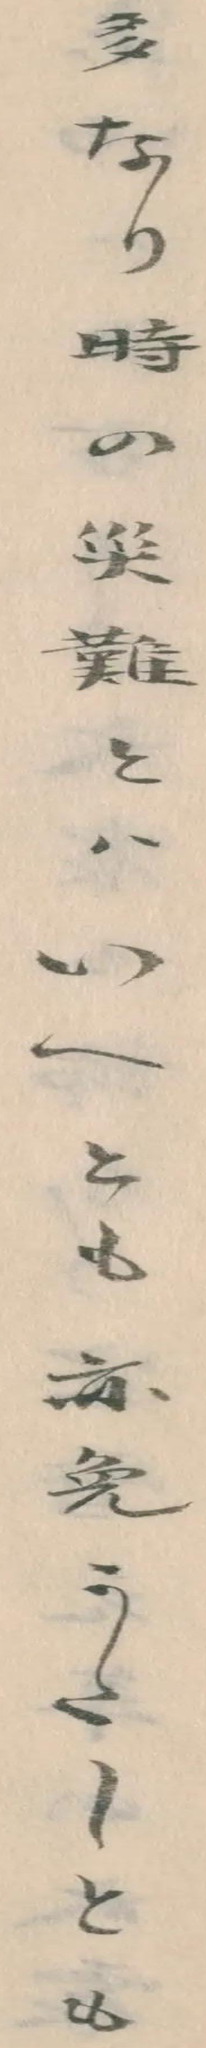多なり時の災難とはいへとも亦免かたしとも
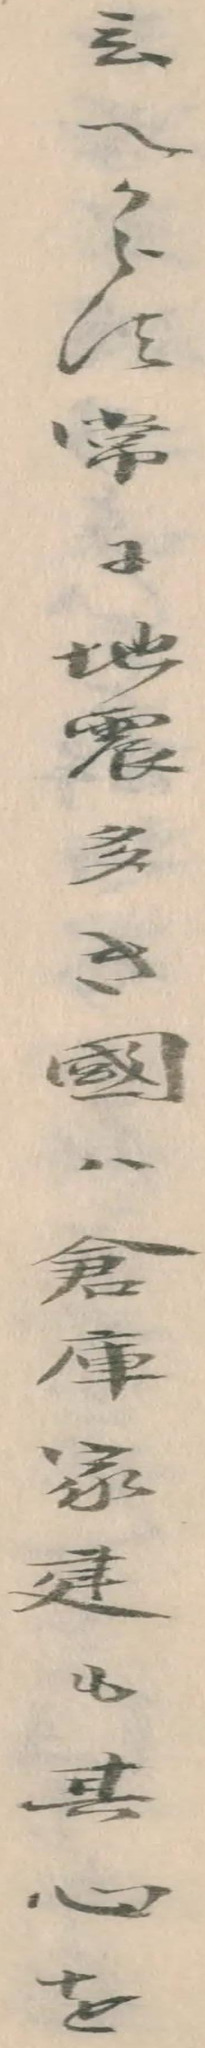言へからす常に地震多き国は倉庫家建も其心を
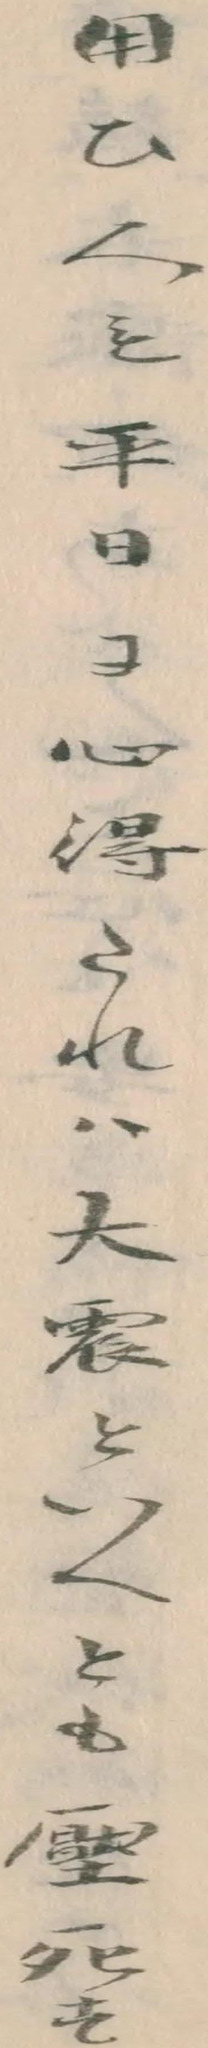用ひ人も平日に心得たれは大震といへとも圧死す
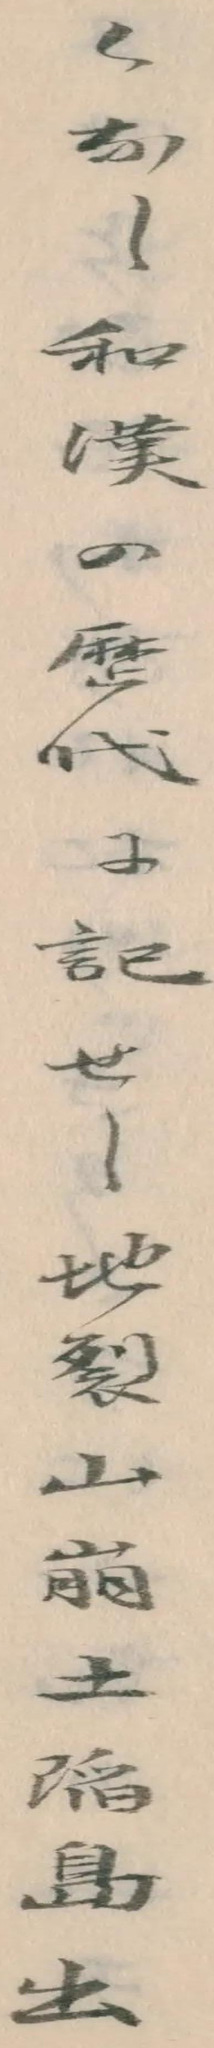くなし和漢の歴代に記せし地裂山崩土陷島出
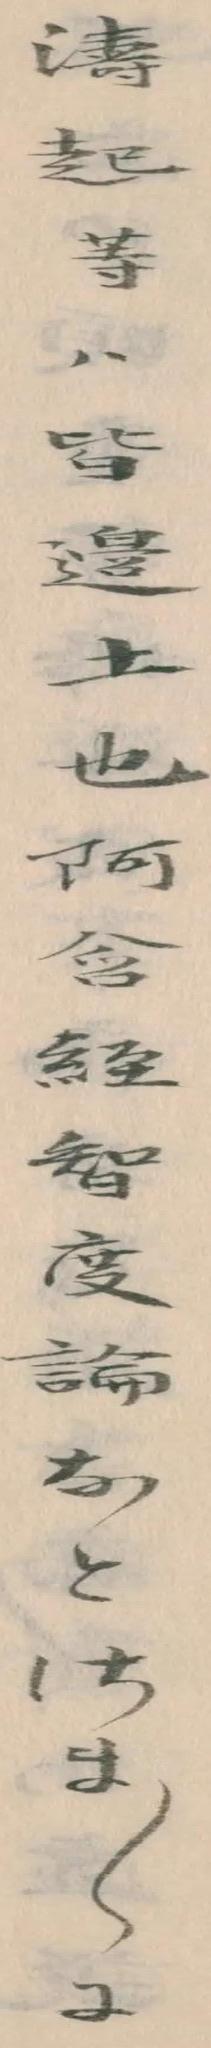涛起等は皆辺土也阿含経智度論なとさま〳〵に
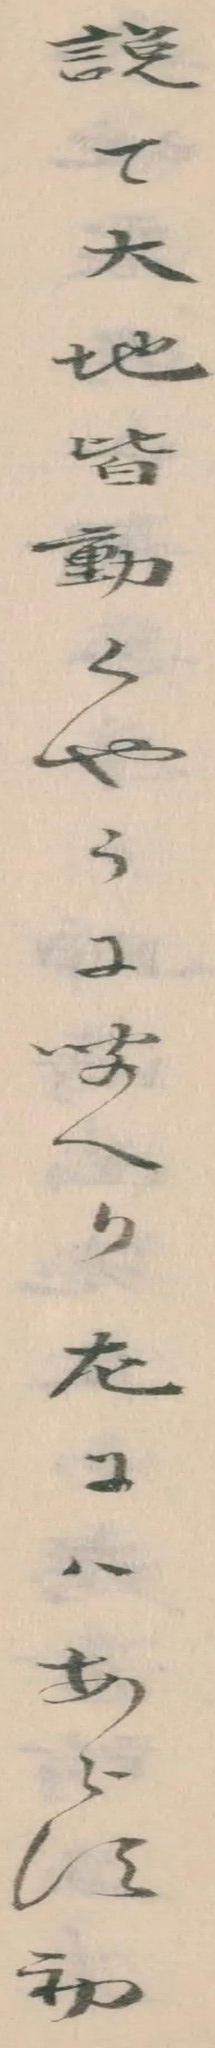説て大地皆動くやうに聞えり左にはあらす初
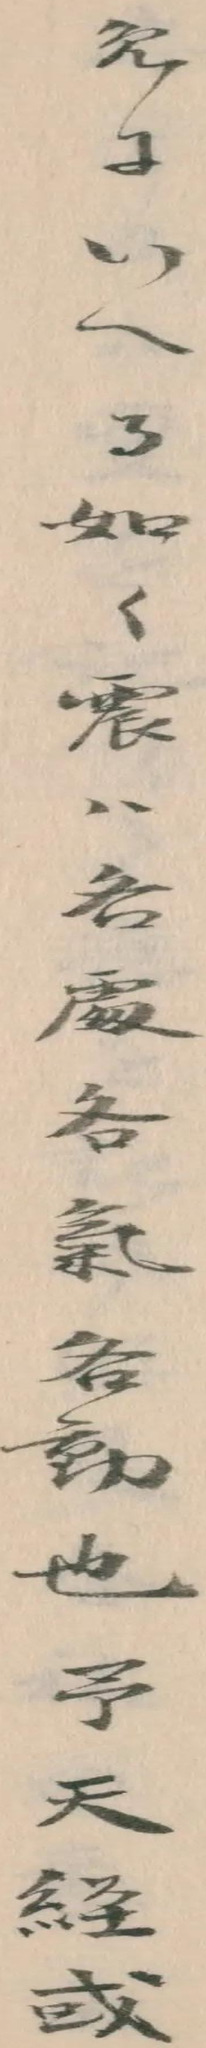めにいへる如く震は各処各気各動也予天経或
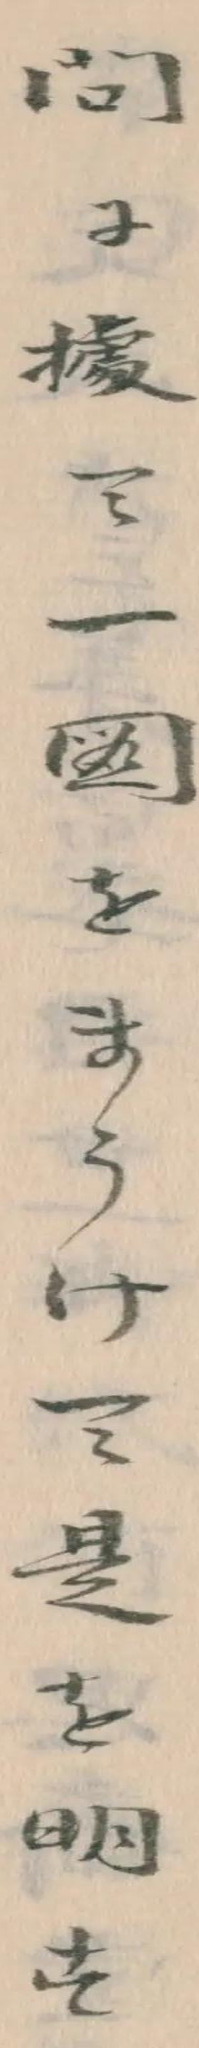問に拠て一図をまうけて是を明す
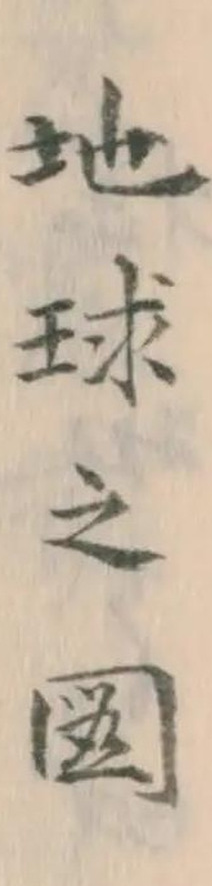地球之図
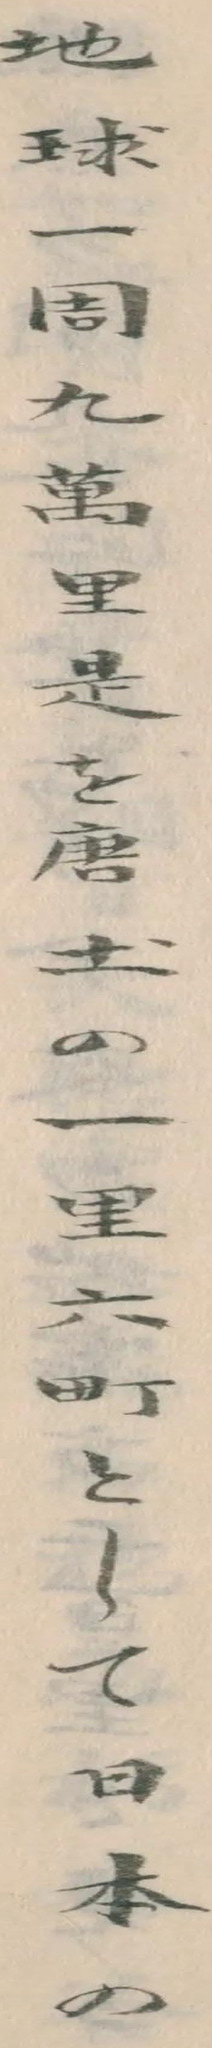地球一周九万里是を唐土の一里六町として日本の
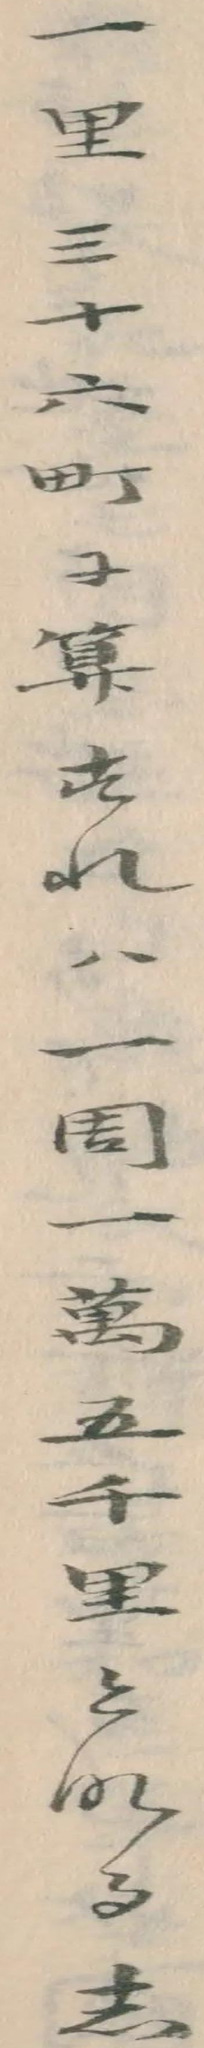一里三十六町に算すれは一周一万五千里となるし
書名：地災撮要. 巻11-12(地震之部)
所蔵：国立国会図書館 National Diet Library, JAPAN
